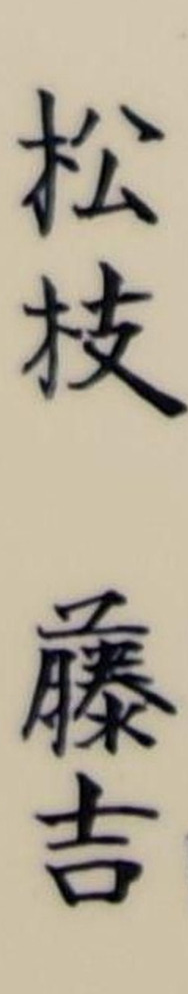松枝藤吉
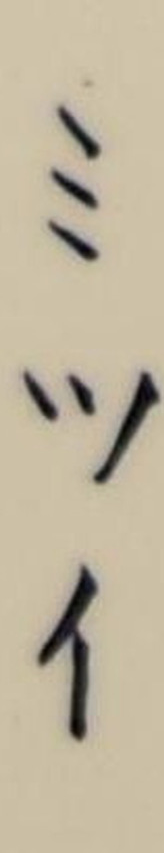ミツイ
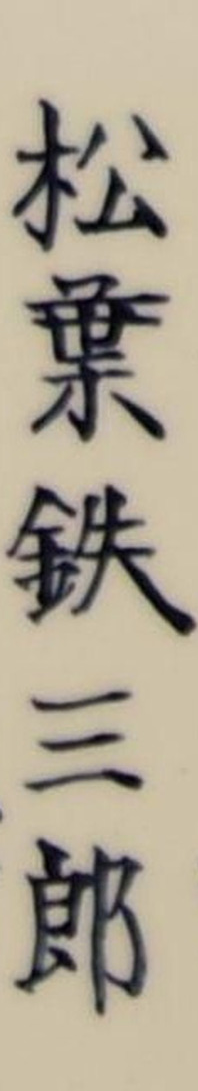松葉鉄三郎
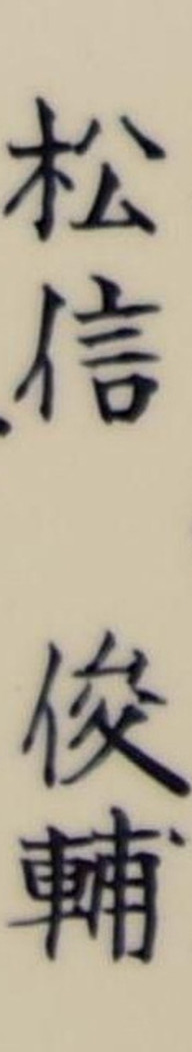松信俊輔
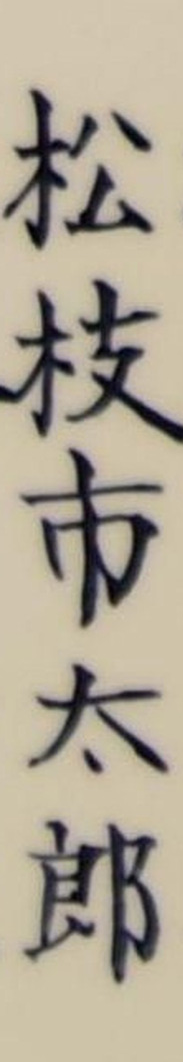松枝市太郎
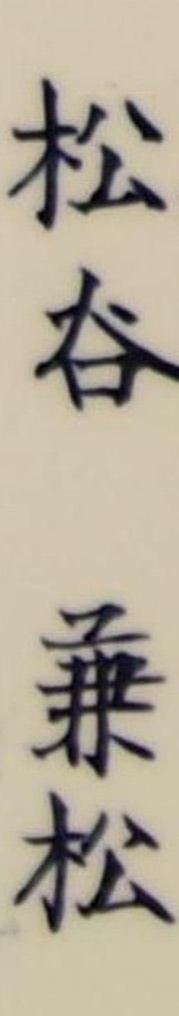松谷兼松
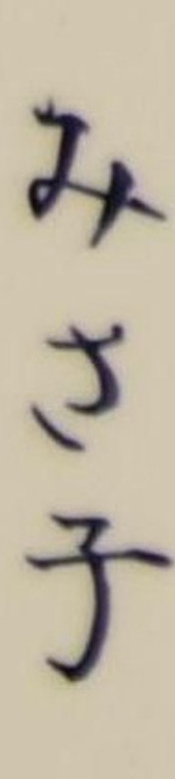みさ子
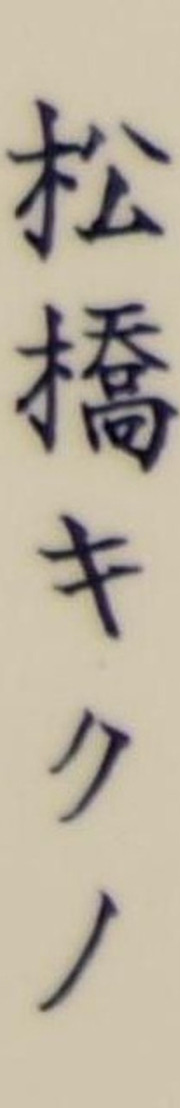松橋キクノ
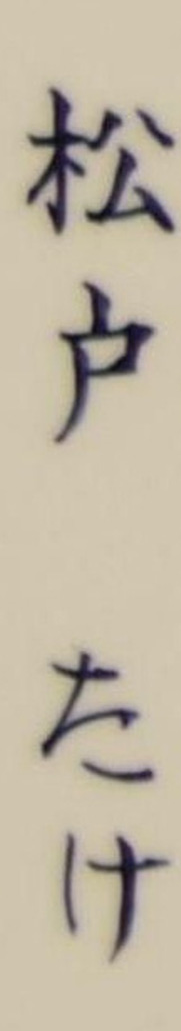松戸たけ
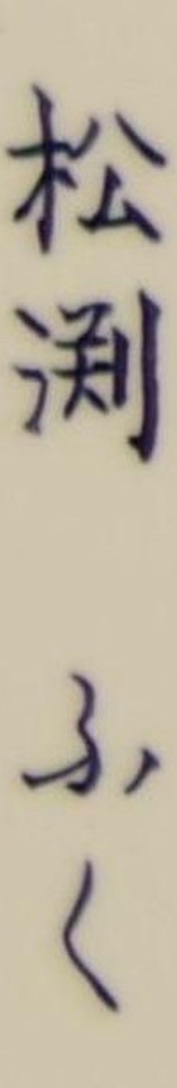松渕ふく
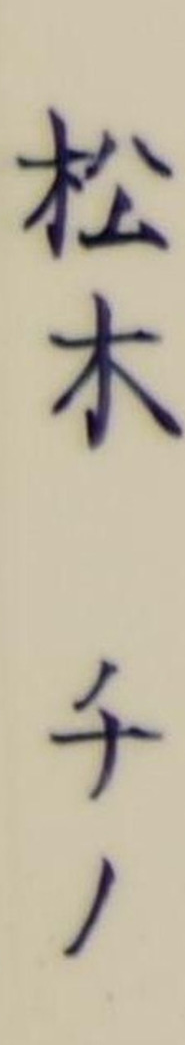松木チノ

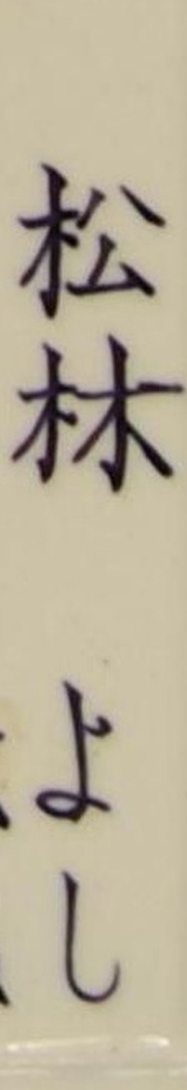松林よし
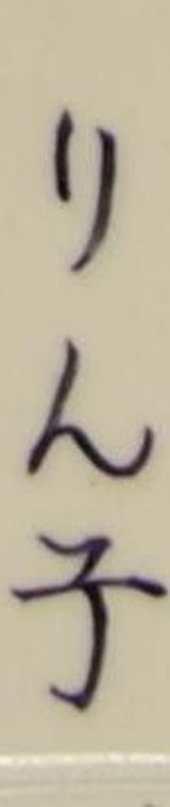りん子
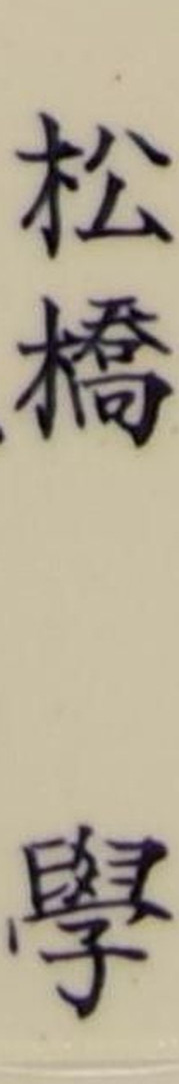松橋学
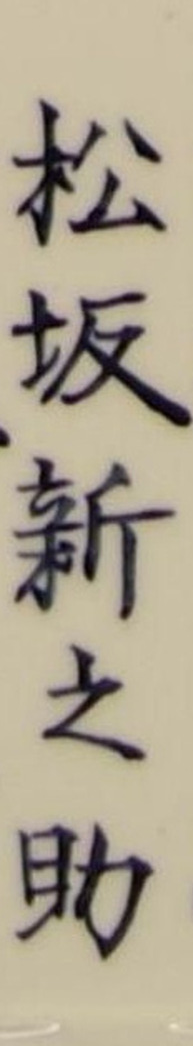松坂新之助
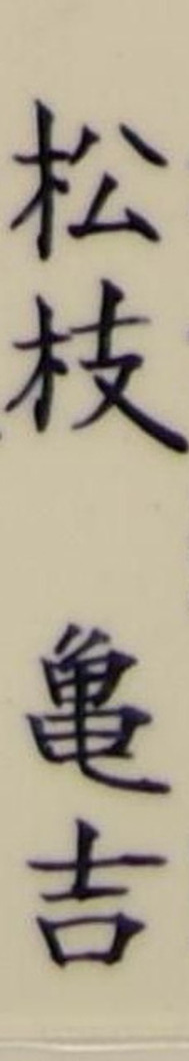松枝亀吉
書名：A~D
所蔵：koyasan kongobuji
